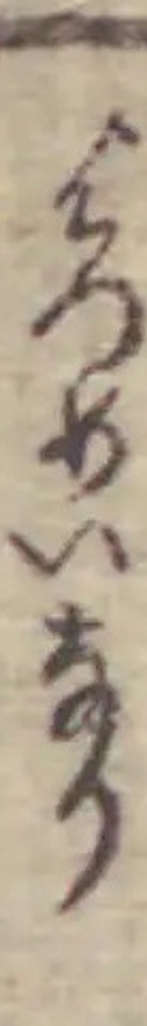はつめいなり
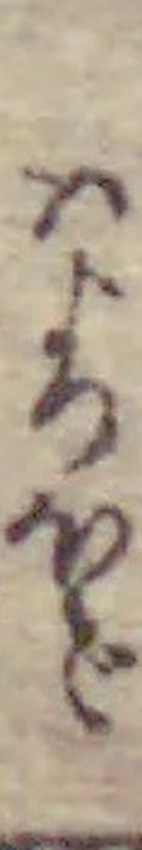はよつほど
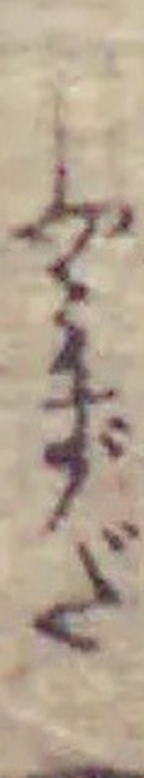しやみずだ
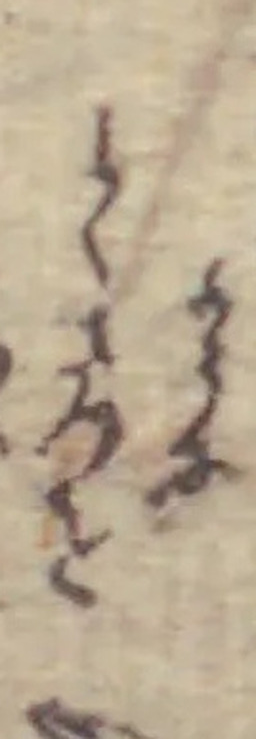よくさつと
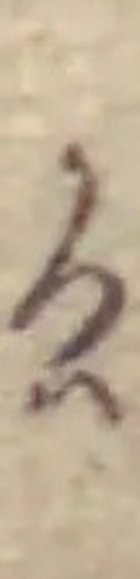かつは
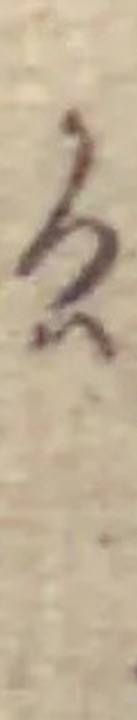かつは
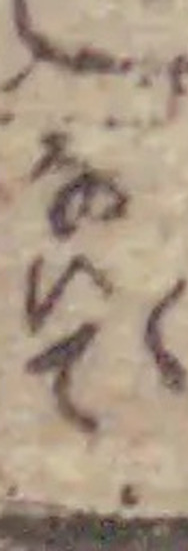ないて
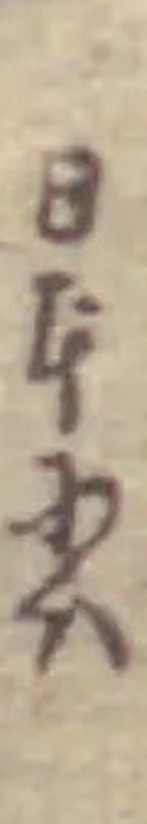日本には
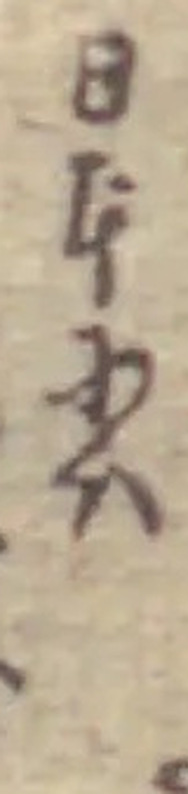日本には
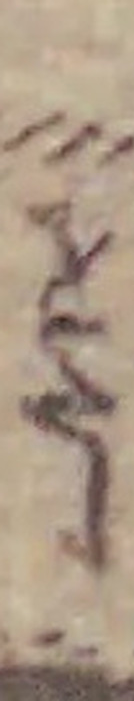をたし
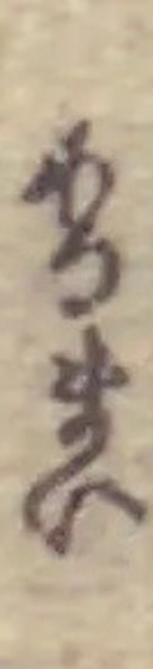あるまい
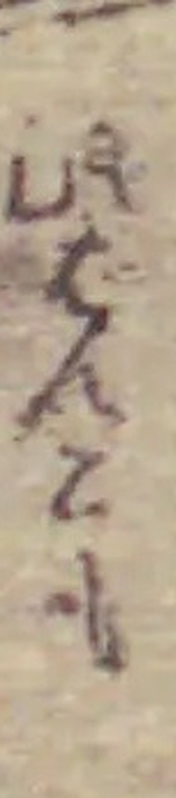此ばんこも
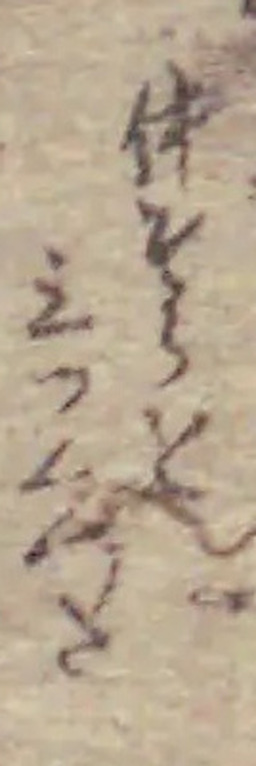三つくつた
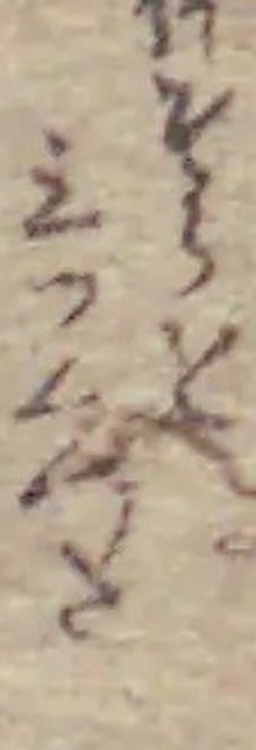三つくつた
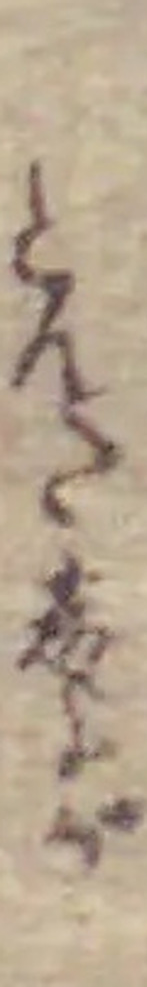とんたしよが

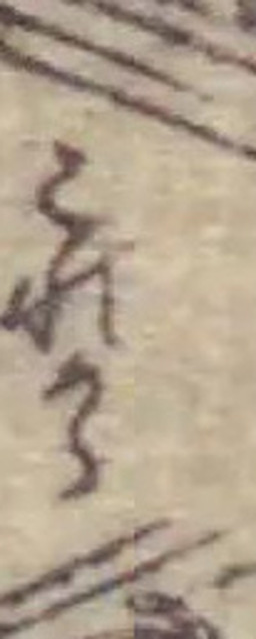これから
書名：夜野中狐物 2巻
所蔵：国立国会図書館 National Diet Library, JAPAN
